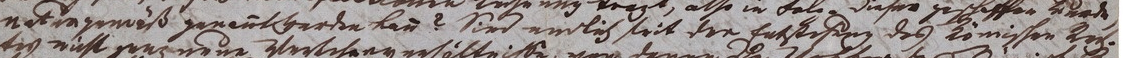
naturgemäß genannt werden kann? Sind endlich seit der Entstehung des Römischen Rech-
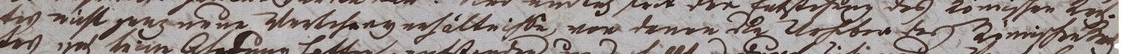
tes nicht ganz neue Verkehrsverhältnisse, von denen die Urheber des Römischen Rech-
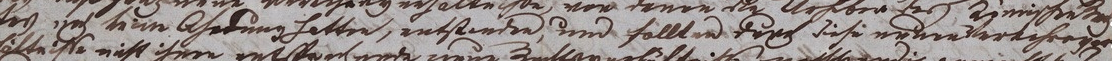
tes noch keine Ahnung hatten, entstanden, und sollten durch diese neuen Verkehrsver-
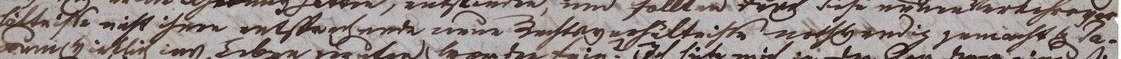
hältnisse nicht ihnen entsprechende neue Rechtsverhältnisse nothwendig gemacht & da-
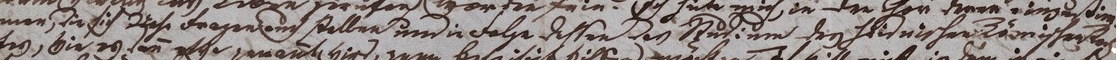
men, die sich diese Fragen auch stellen und in Folge dessen das Studium des heidnischen Römischen Rech-
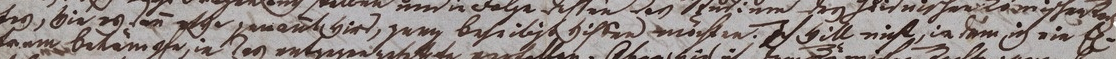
tes, wie es dann etwa genannt wird, ganz beseitigt wissen möchten. Ich will nicht, indem ich ein Ex-
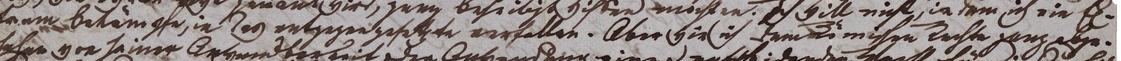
trem bekämpfe, in das entgegengesetzte verfallen. Aber wie ich dem Römischen Rechte ganz abge-
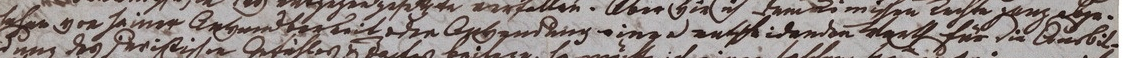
sehen von seiner Anwendbarkeit oder Anwendung einen entscheidenden Werth für die Ausbil-
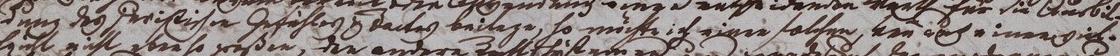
dung des juristischen Gefühles & Tactes beilege, so möchte ich einen solchen, wenn auch einen viel-
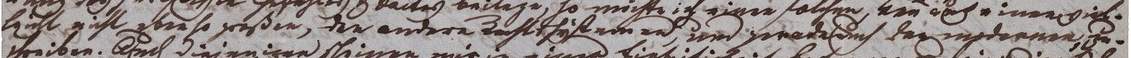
leicht nicht ebenso großen, den andern Rechtssystemen, und gerade auch den modernen, zu-
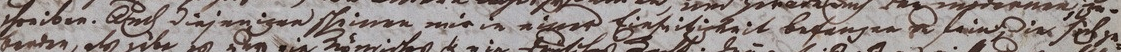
schreiben. Auch diejenigen scheinen mir in einer Einseitigkeit befangen zu sein, die sich ge-
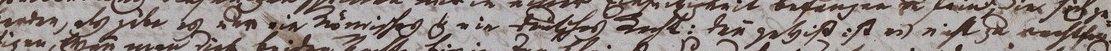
berden, als gäbe es nur ein Römisches & ein deutsches Recht: denn gewiß ist es nicht zu rechtfer-
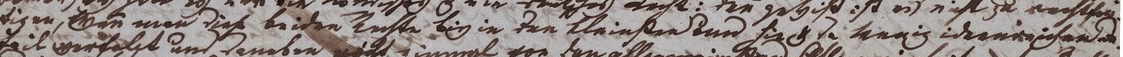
tigen, wenn man diese beiden Rechte bis in den kleinsten und hie & da wenig ideenreichen De-
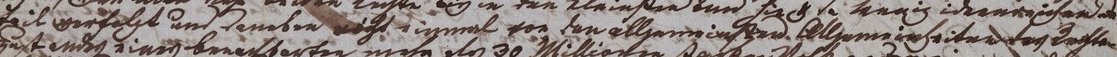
tail verfolgt und daneben nicht einmal von den allgemeinsten Allgemeinheiten des Rechts-
